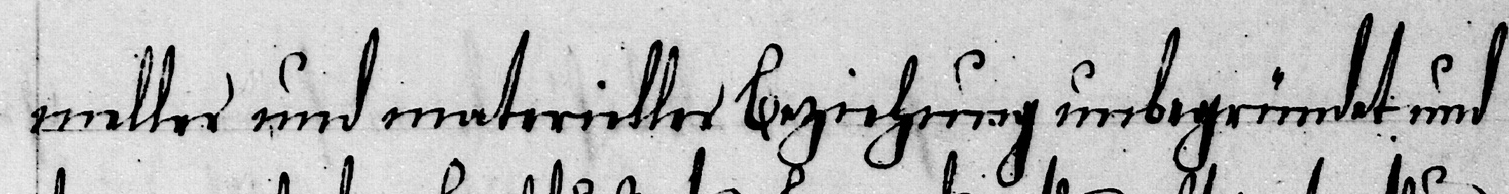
meller und materieller Beziehung unbegründet und
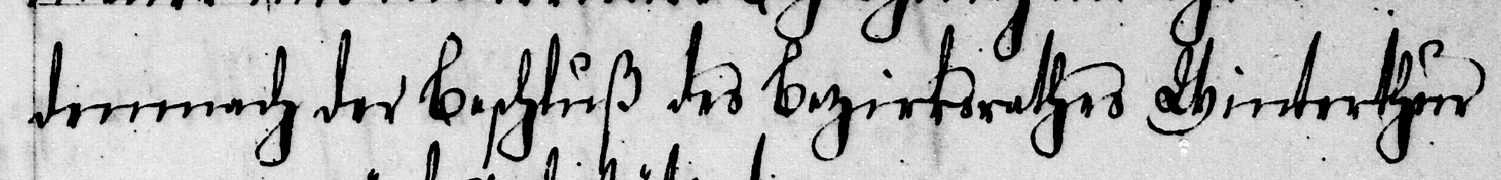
demnach der Beschluß des Bezirksrathes Winterthur
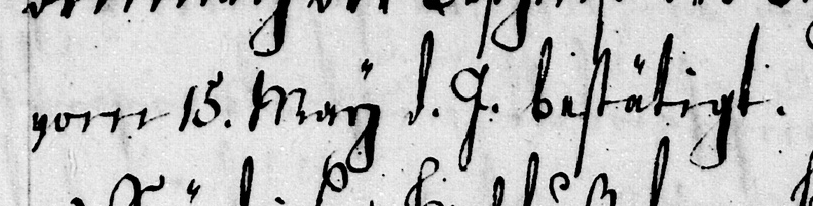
vom 15. May d. J. bestätigt.
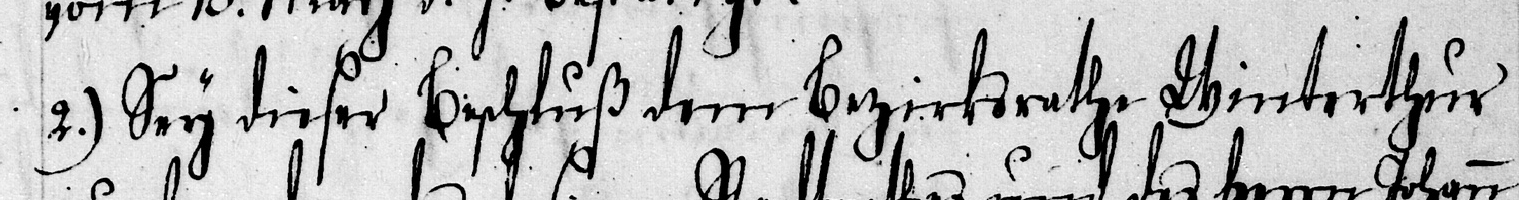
2.) Sey dieser Beschluß dem Bezirksrathe Winterthur
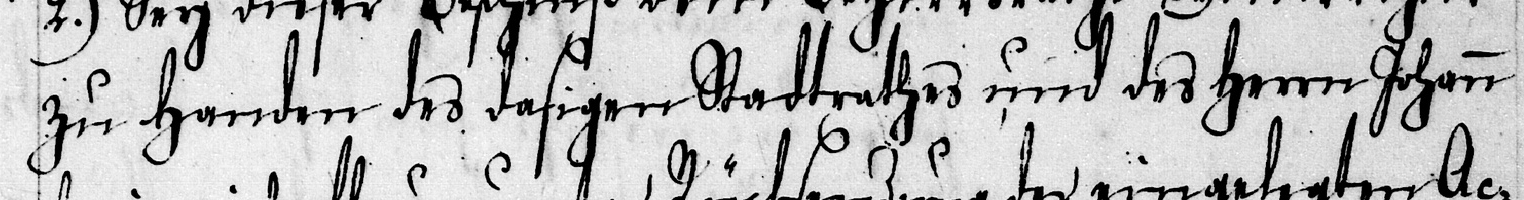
zu Handen des dasigen Stadtrathes und des Herrn Johann
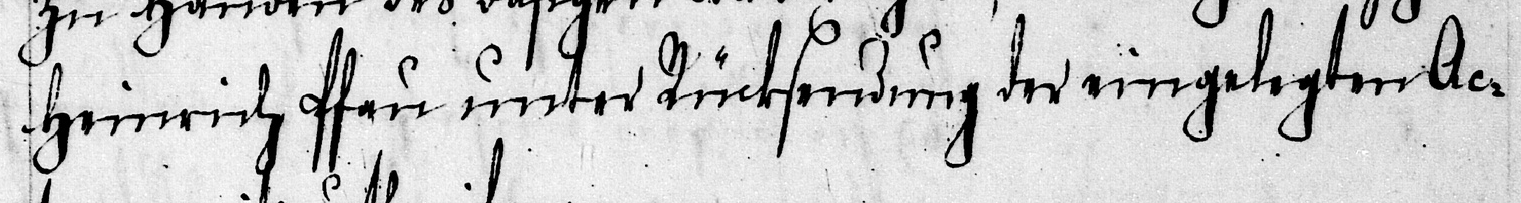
Heinrich Pfau unter Rücksendung der eingelegten Ac¬
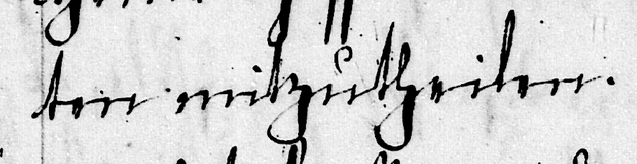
ten mitzutheilen.
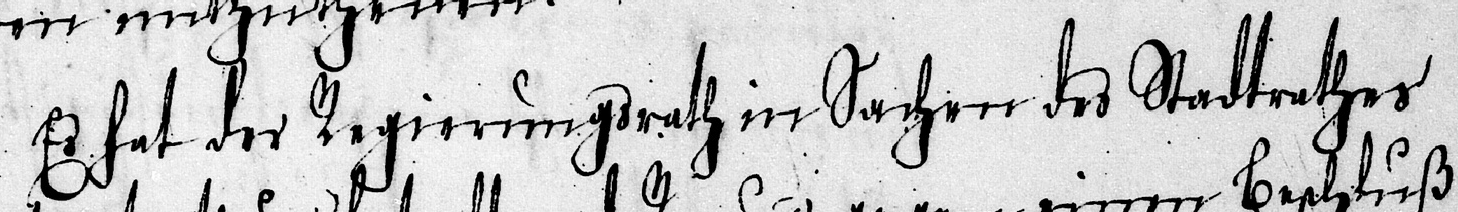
Es hat der Regierungsrath in Sachen des Stadtrathes
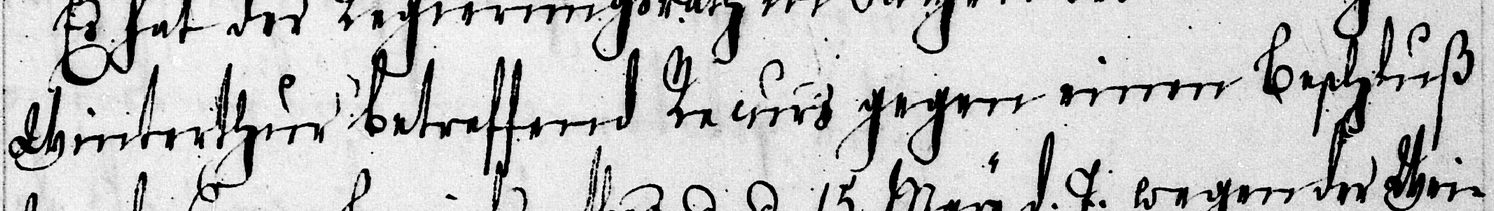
Winterthur betreffend Recurs gegen einen Beschluß
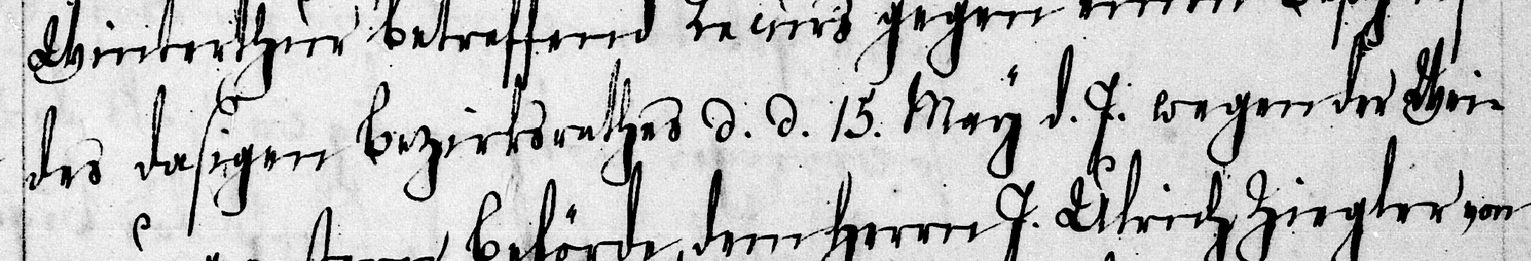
des dasigen Bezirksrathes d. d. 15. May d. J. wegen der Wei¬
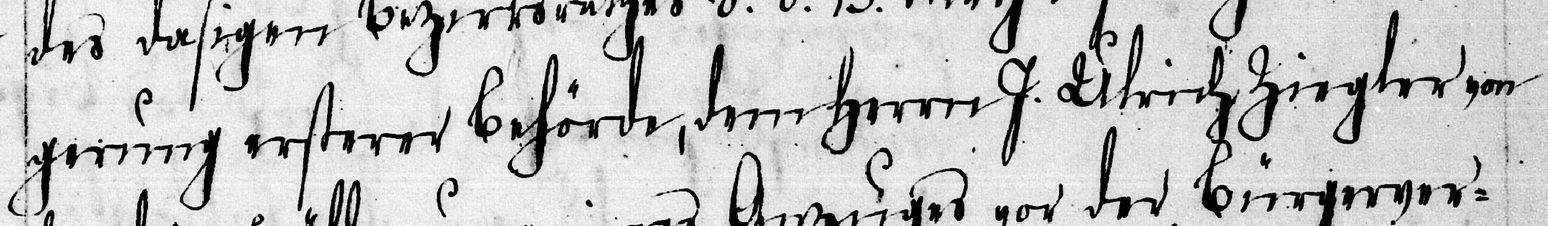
gerung ersterer Behörde, dem Herrn J. Ulrich Ziegler von
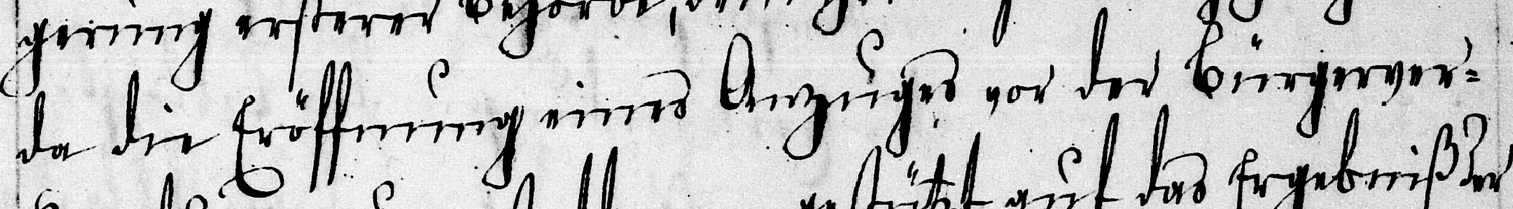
da die Eröffnung eines Anzuges vor der Bürgerver¬
